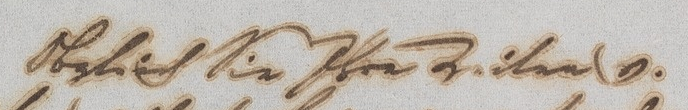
Obgleich Sie Ihre Zeilen v.
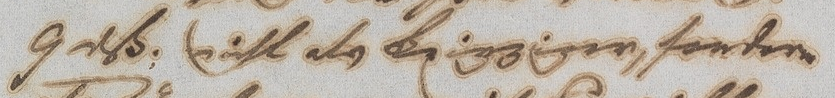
9 dß. nicht als Leipziger, sondern
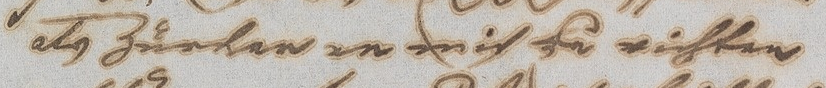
als Zürcher an mich zu richten
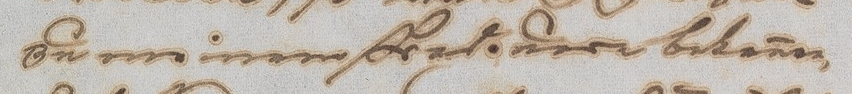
zu meinem Bedauern bekennen,
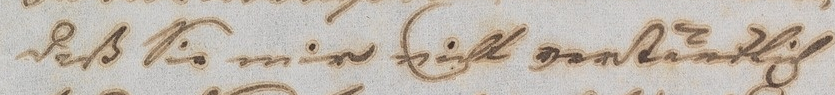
daß Sie mir nicht verständlich
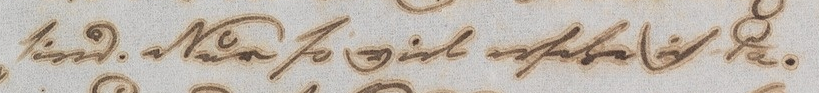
sind. Nur so viel ersehe ich da-
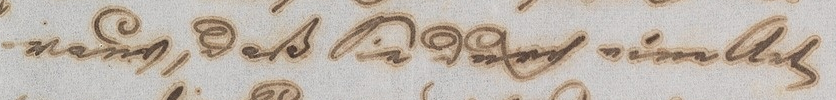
raus, daß Sie durch eine Art
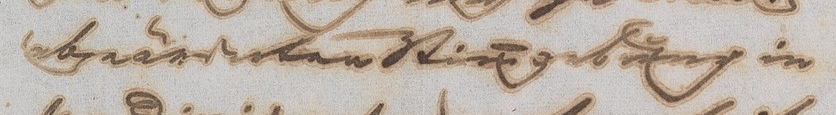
abgeänderten Stimmgebung in
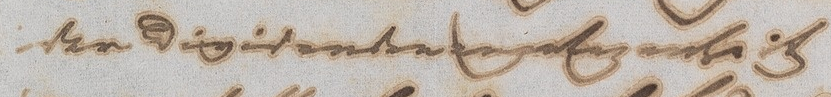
der Dividendenangelegenheit
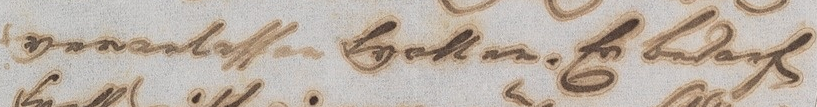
veranlassen wollen. Es bedarf
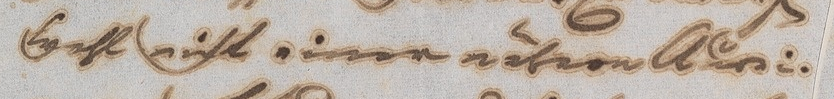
wohl nicht einer nähern Ausei-
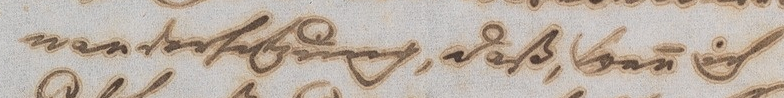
nandersetzung, daß, wenn ich
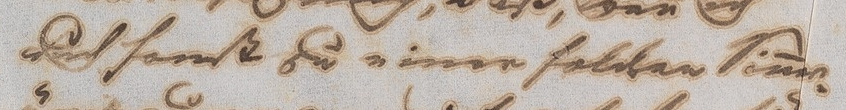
auch sonst zu einer solchen Sinnes-
